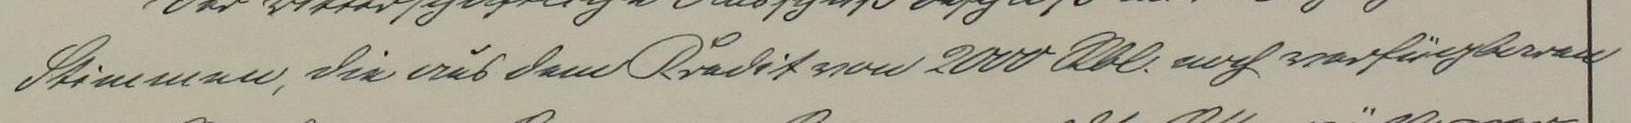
Stimmen, die aus dem Kredit von 2000 Rbl. noch verfügbaren
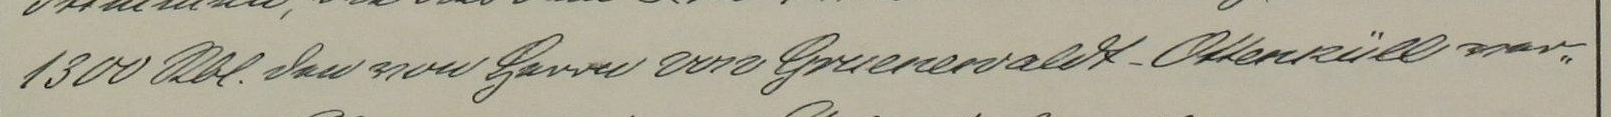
1300 Rbl. den von Herrn von Gruenewaldt-Ottenküll ver-
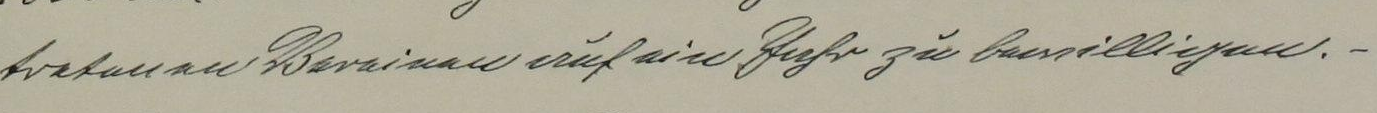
tretenen Vereinen auf ein Jahr zu bewilligen.
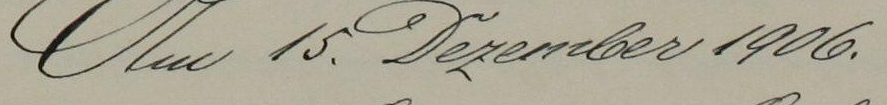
Am 15. Dezember 1906.
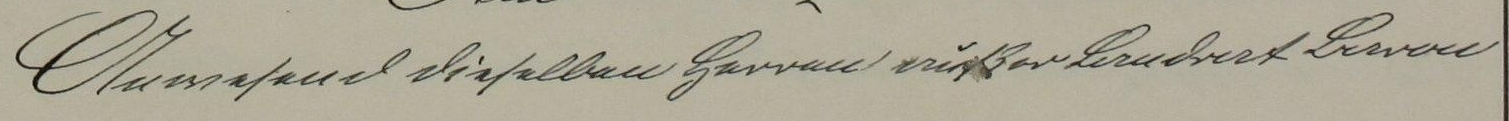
Anwesend dieselben Herren außer Landrat Baron
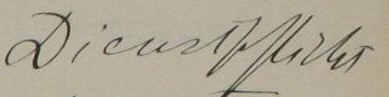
Dienstpflichten
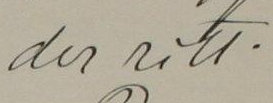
der ritt.
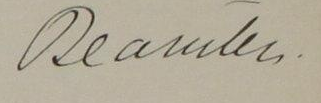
Beamten
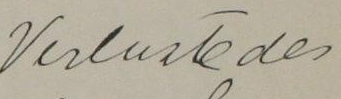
Verluste des
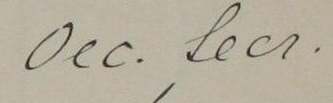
Oec. Secr.
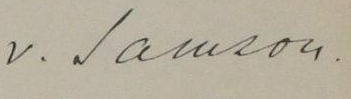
v. Samson
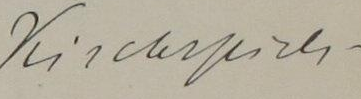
Kirchspiels-
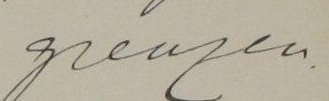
grenzen.
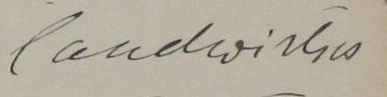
Landwirtsch.
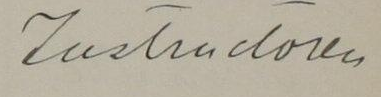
Instructoren
